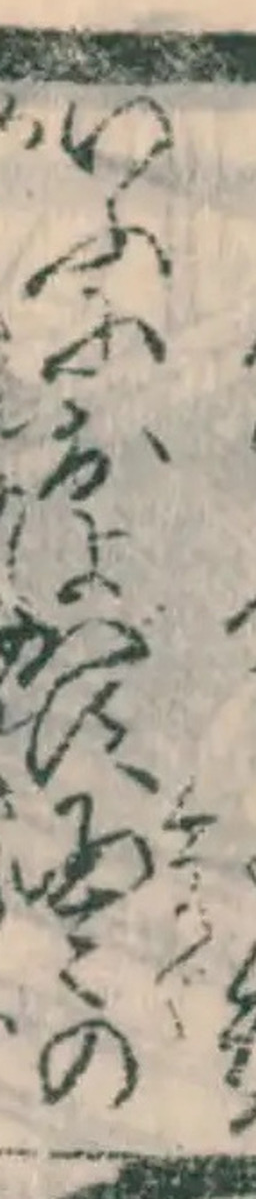いふにおよばす国々の
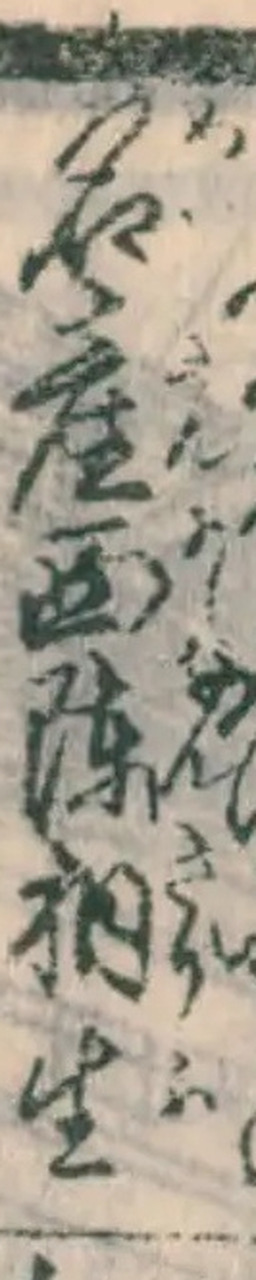名産西陣桐生
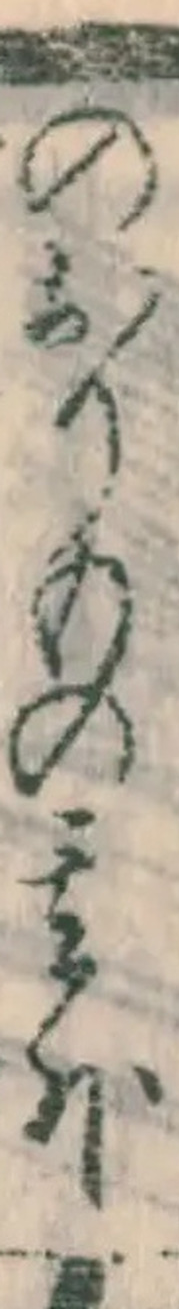のおりもの其外
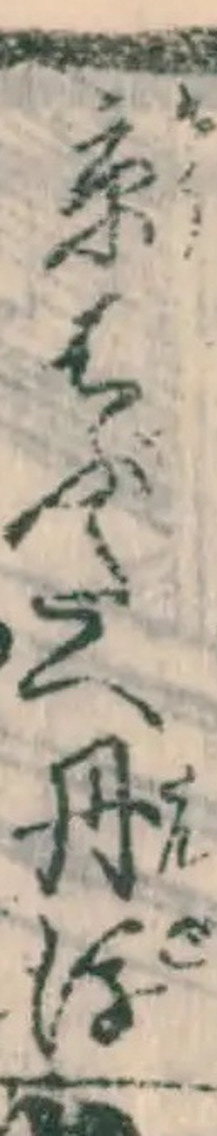京都はぶたへ丹後
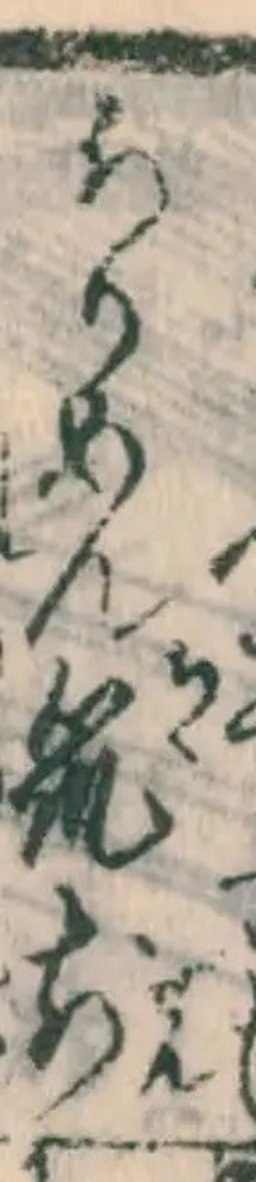ちりめん筑前
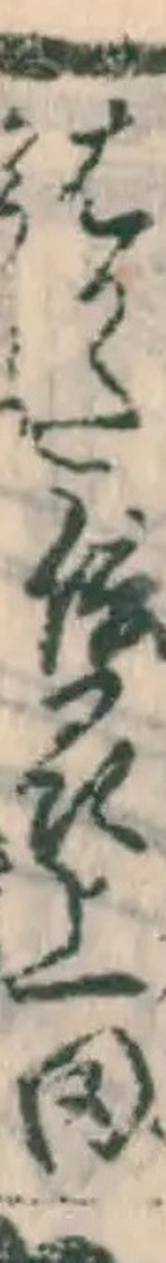はかた信州上田
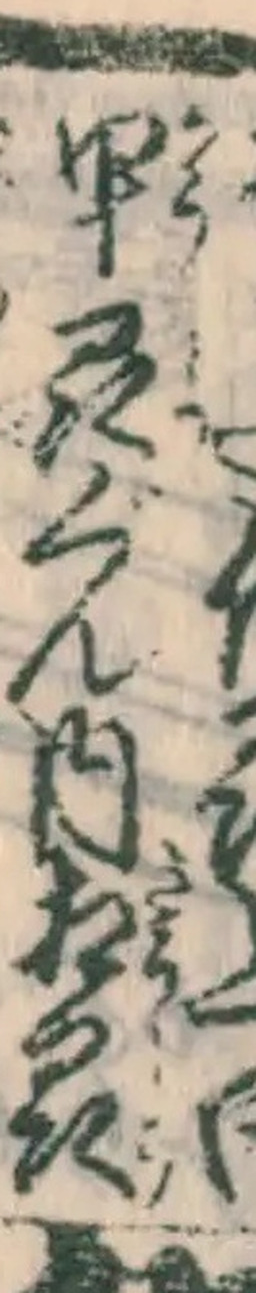甲州ぐん内相州
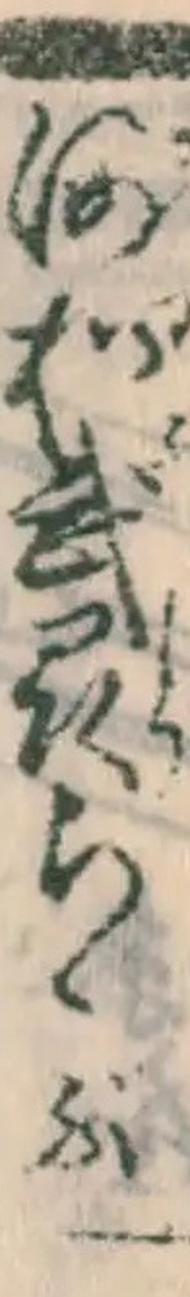河和武州ちくぶ
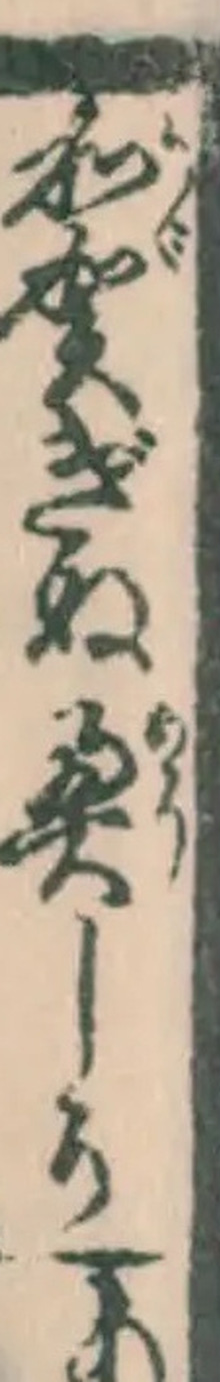加賀ぎぬ奥しう
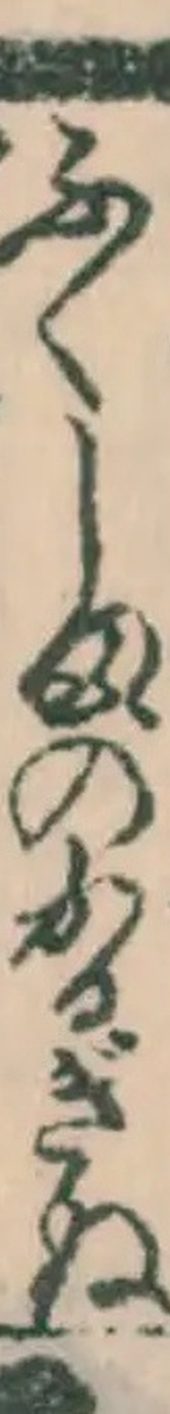ふくしまのかるぎぬ
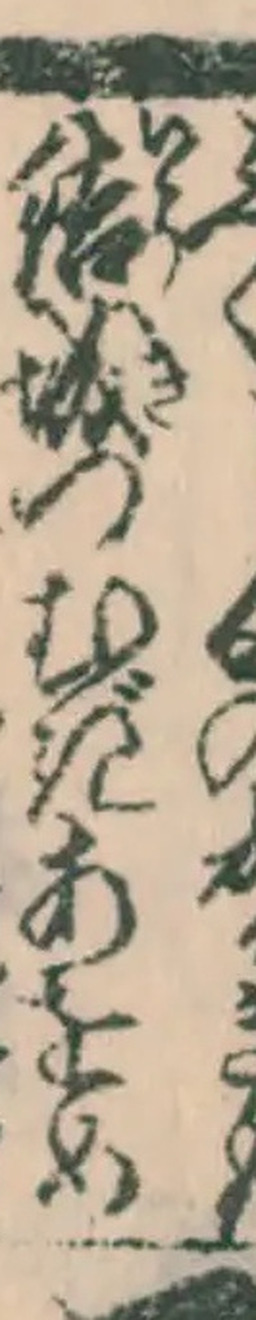結城つむぎあをめ
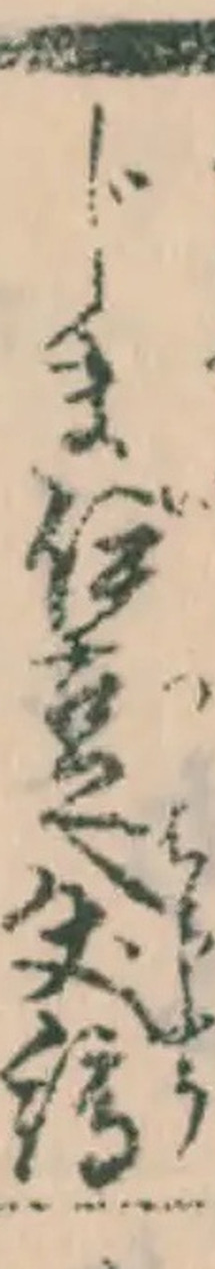じま伊豆八丈縞
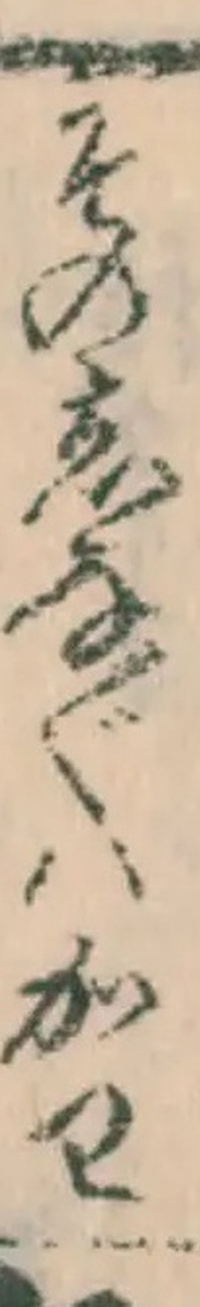そのしな〴〵かわ
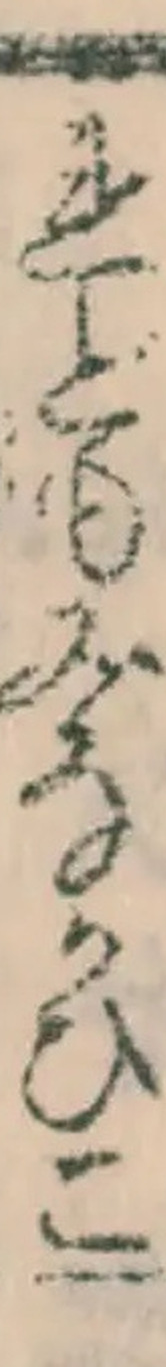れどもみなかひこ
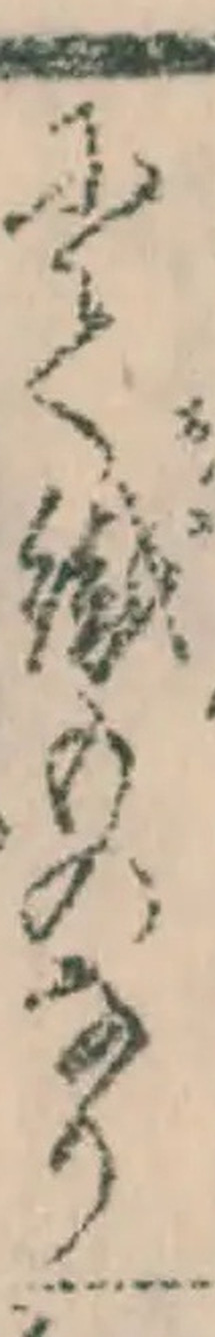にて織ものなり
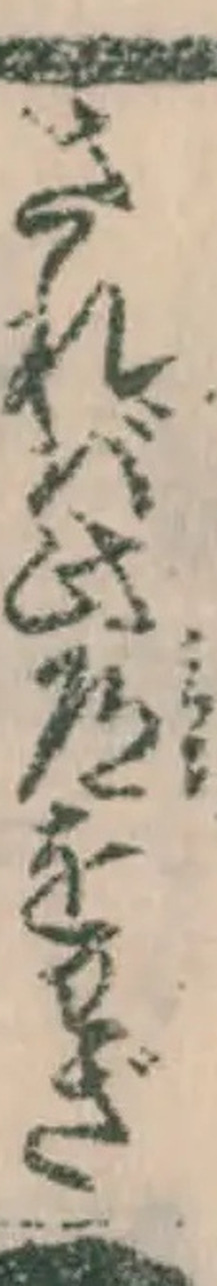されば此道をわざ
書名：養蚕往来
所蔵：国立国会図書館 National Diet Library, JAPAN
